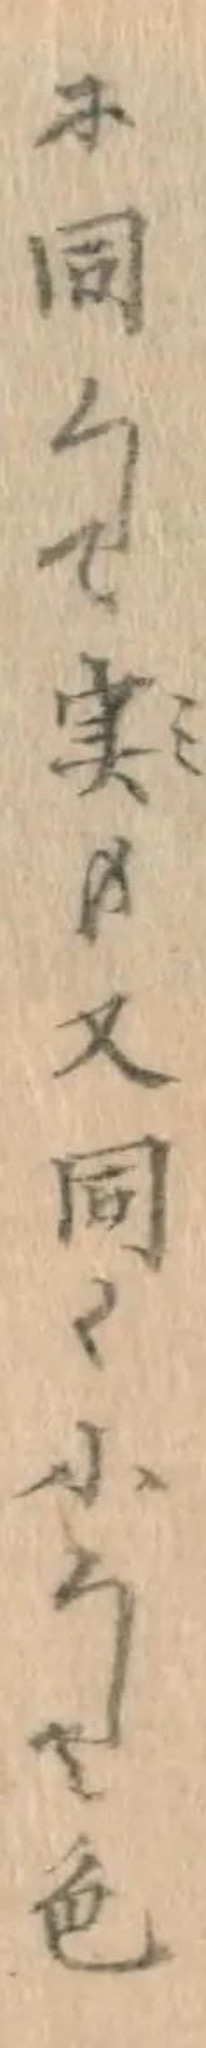に同くして実も又同く小くして色
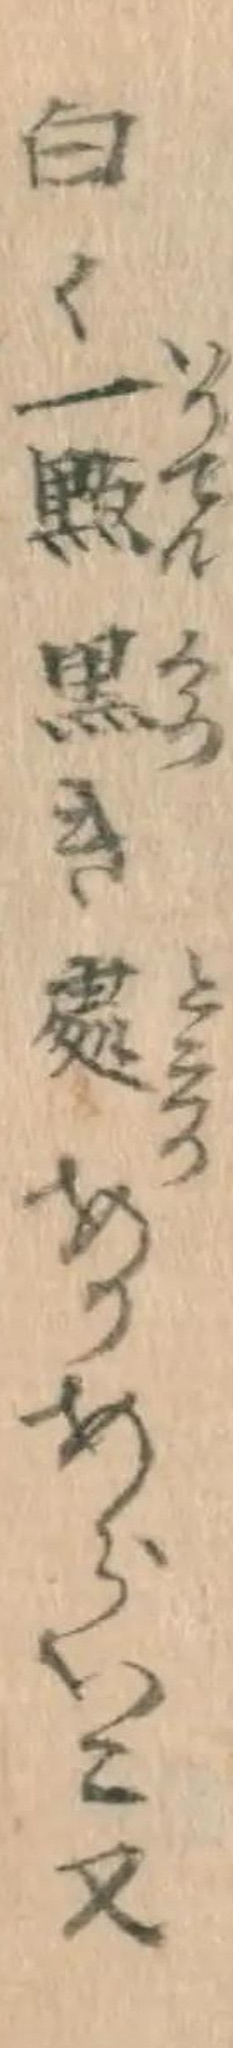白く一点黒き処ありあらいこ又
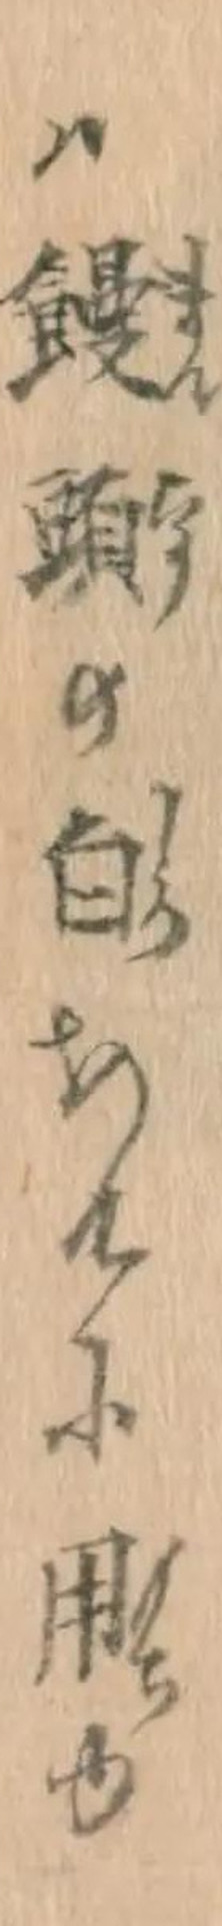は饅頭の白あんに用ゆ
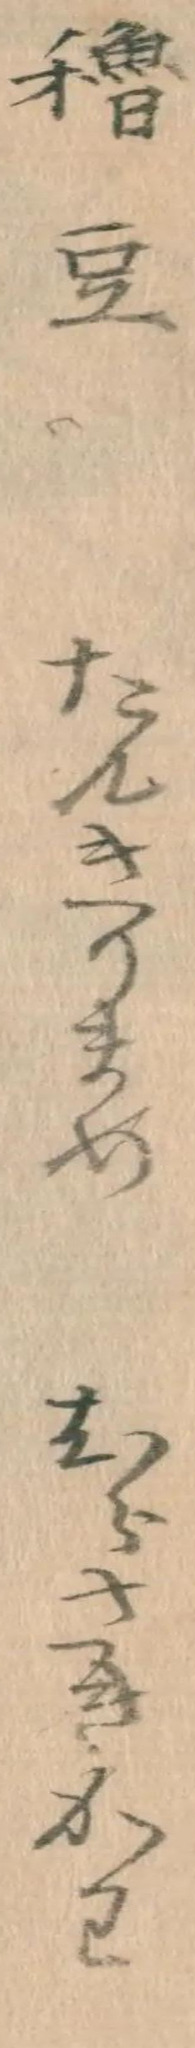穭豆たんきりまめむらさきかわ
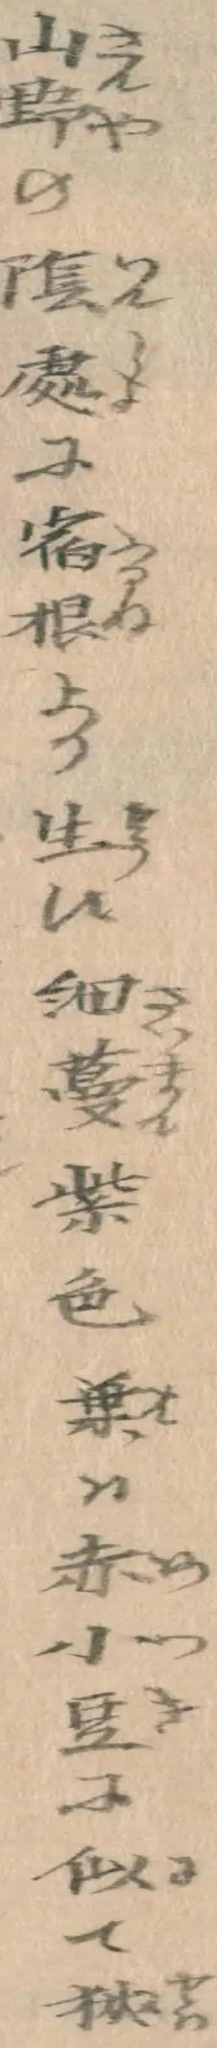山野の陰処に宿根より生す細蔓紫色葉は赤小豆に似て狭
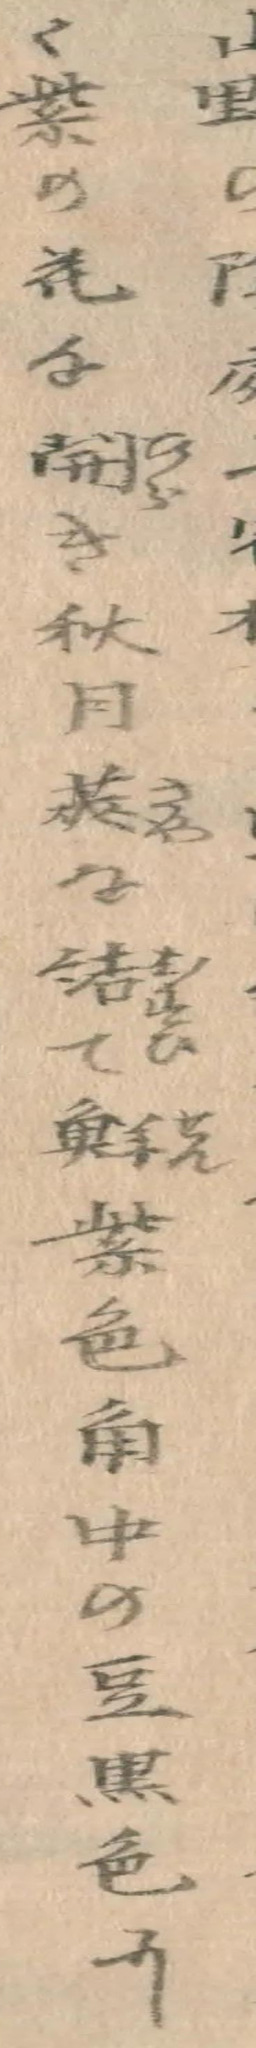く紫の花を開き秋月莢を結て鮮紫色角中の豆黒色にし
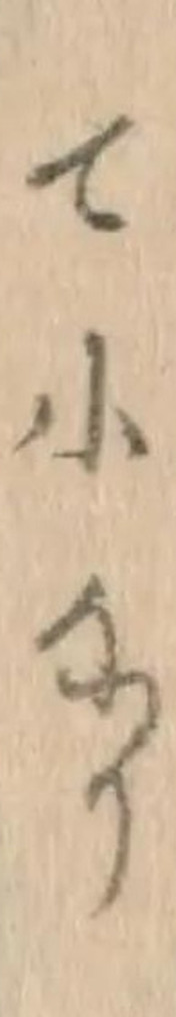て小なり

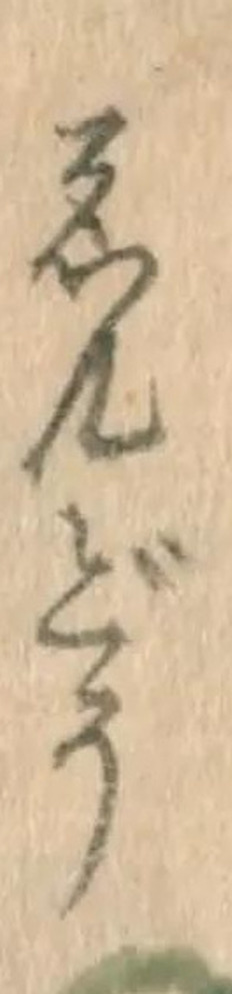ゑんどう
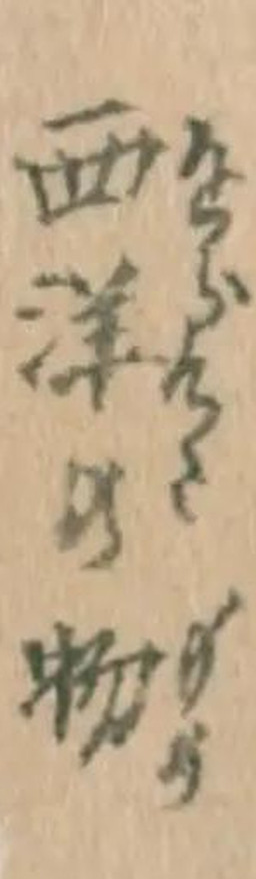西洋の物
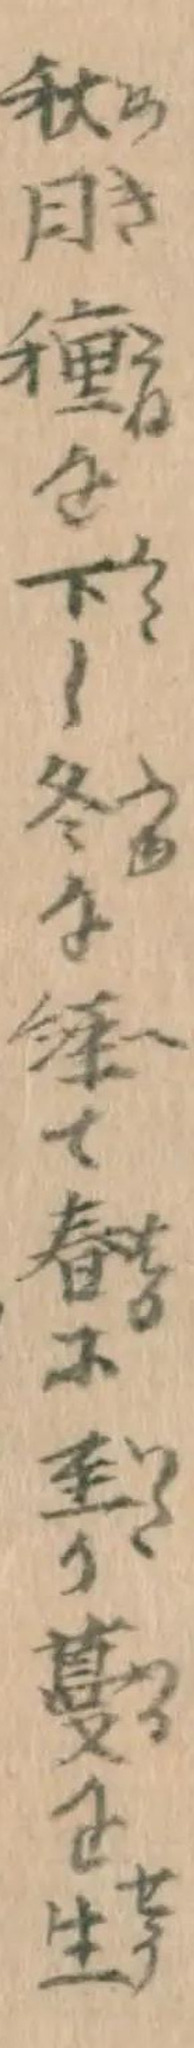秋月種を下し冬を経て春に至り蔓を生
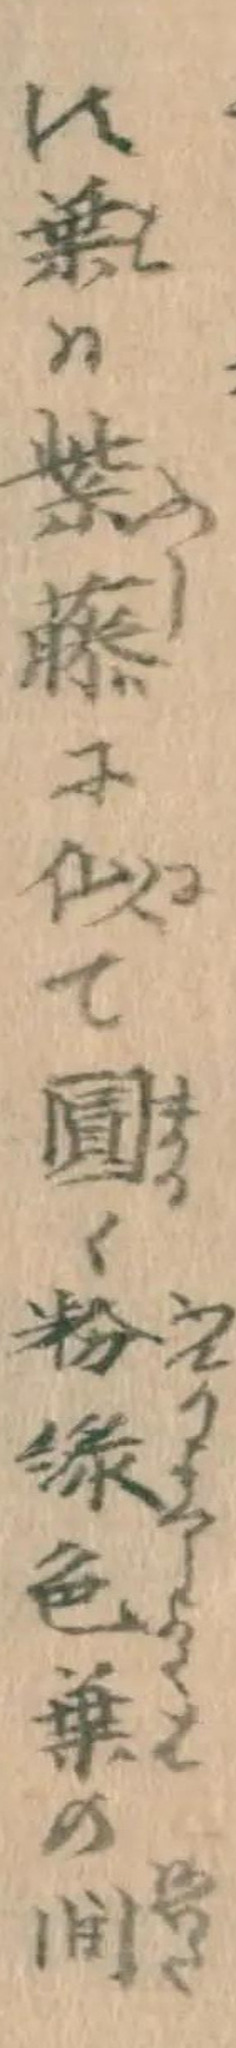す葉は紫藤に似て円く粉緑色葉の間
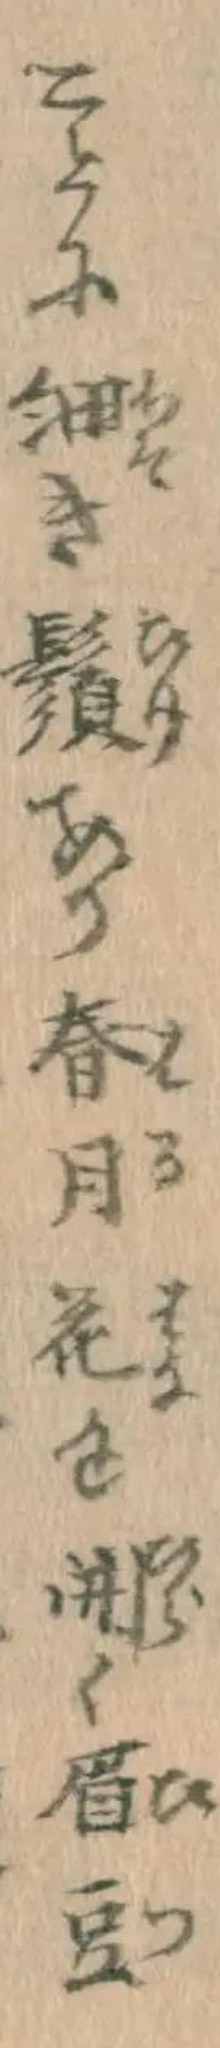ことに細き鬚あり春月花を開く眉豆
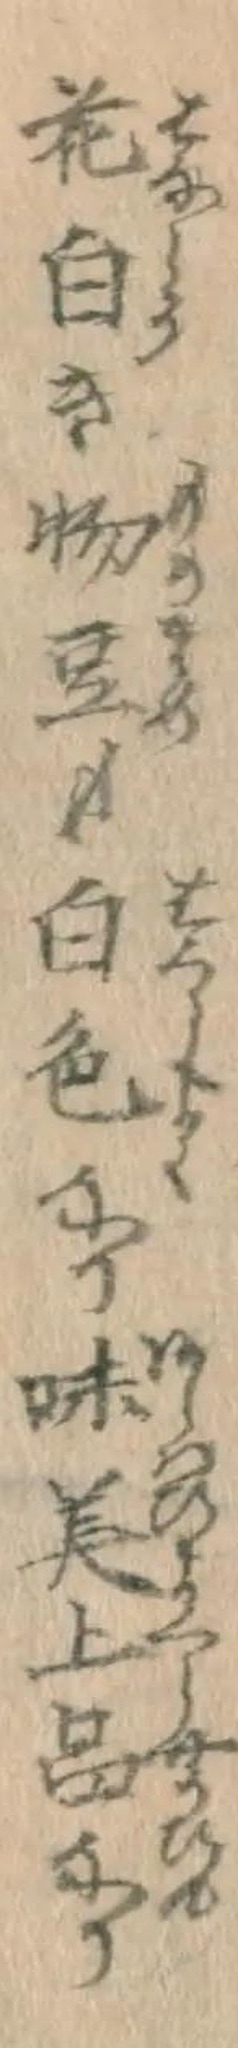花白き物豆も白色なり味美上品なり
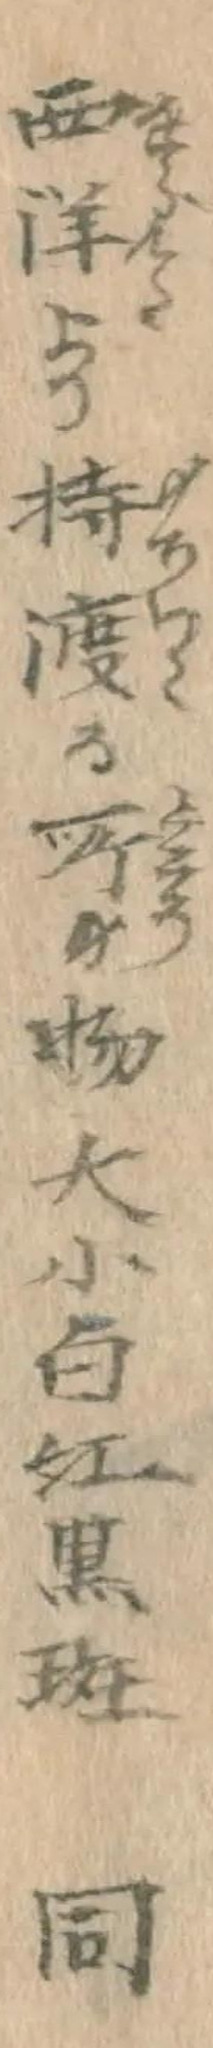西洋より持渡る所の物大小白紅黒斑
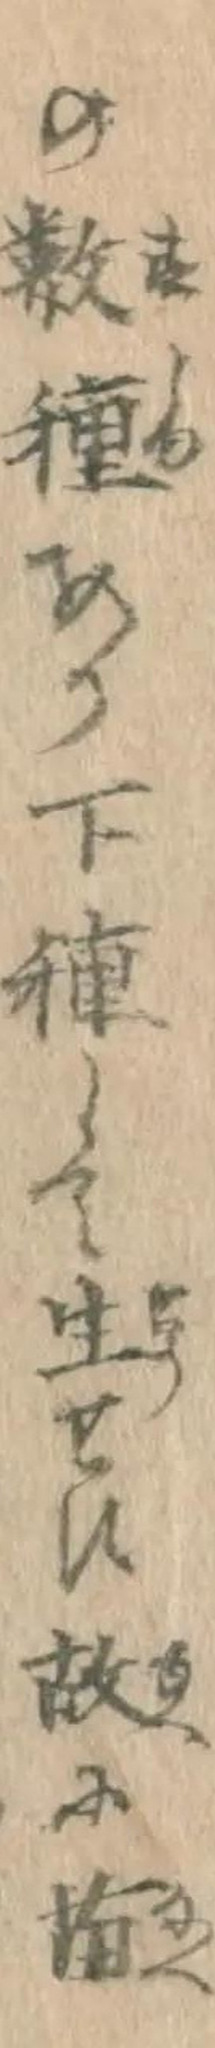の数種あり下種して生せす故に苗
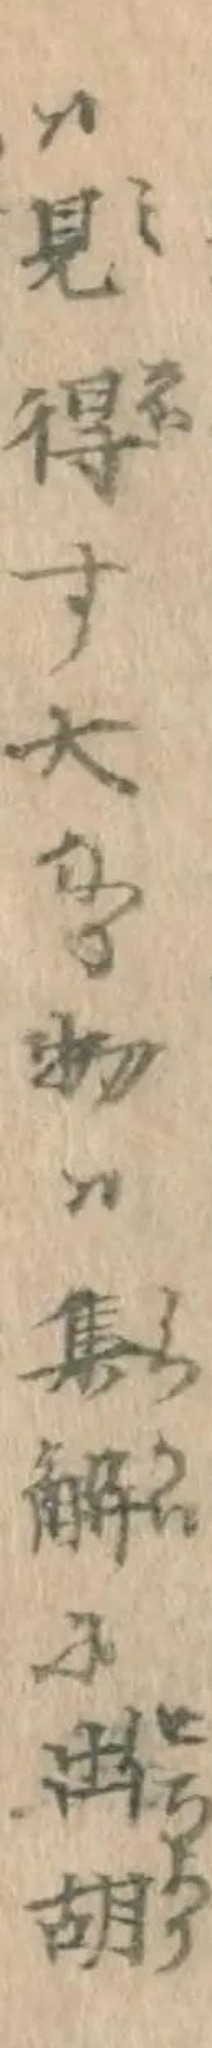は見得す大なる物は集解に出胡
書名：本草図譜. 巻43-45
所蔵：国立国会図書館 National Diet Library, JAPAN
